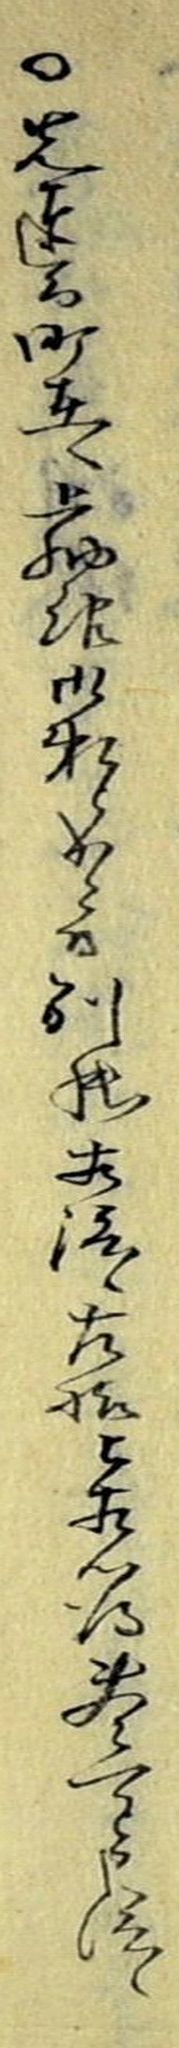○先達而町在へ上納銀御頼被成候に付別紙相渡候左様被相心得夫々可被申渡候

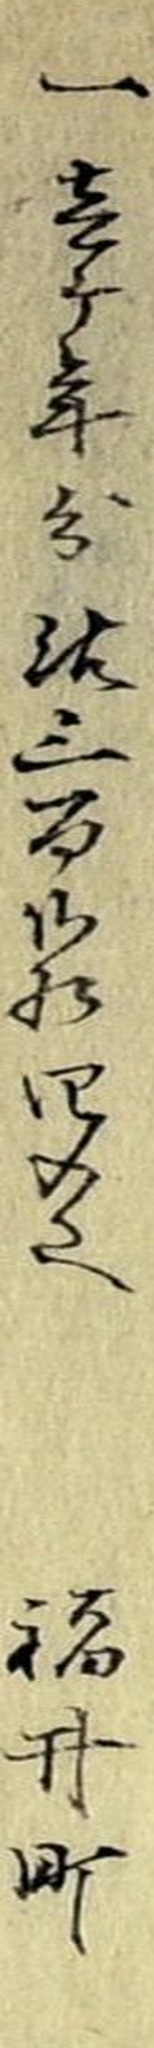一壱ヶ年分銀三百弐拾四貫匁福井町
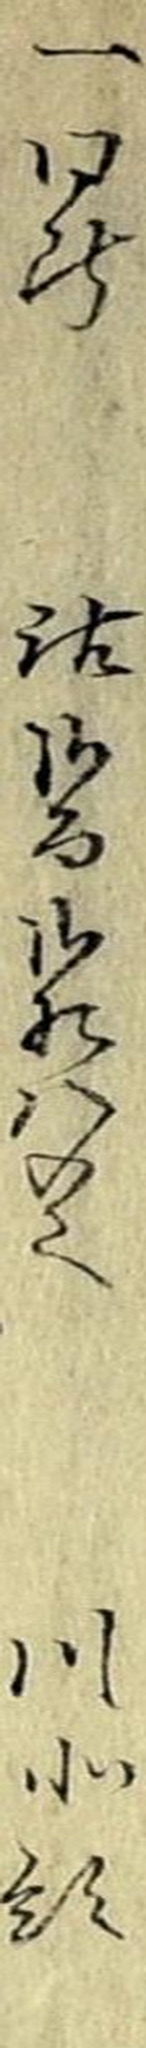一同断銀弐百弐拾八貫匁川北領
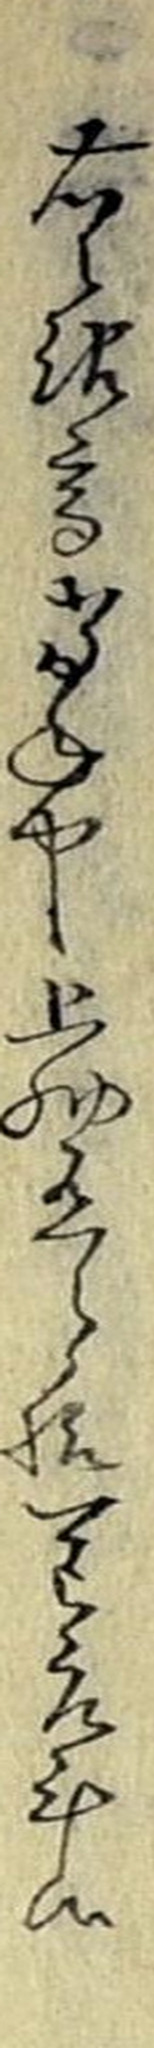右之銀高当年中上納有之候様可被取斗候
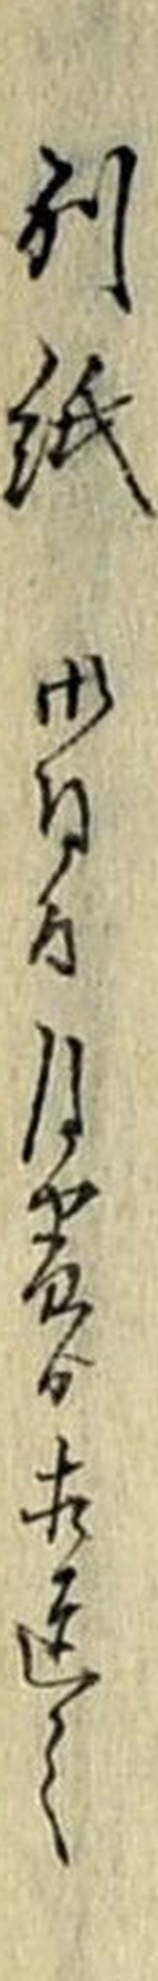別紙御目付月番ゟ藍達之
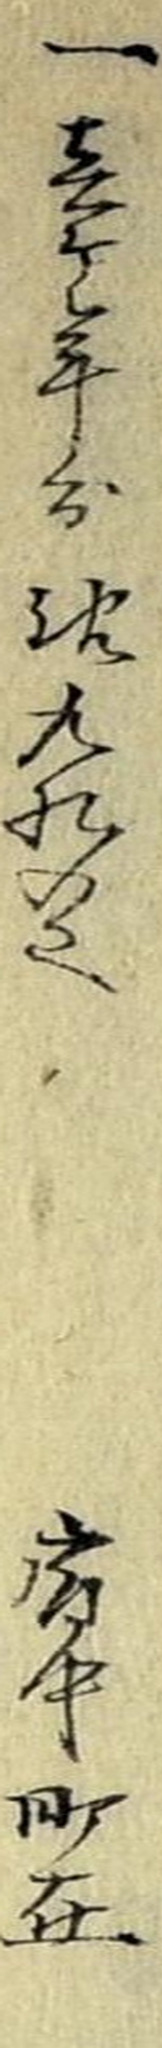一壱ヶ年分銀九拾貫匁府中町在
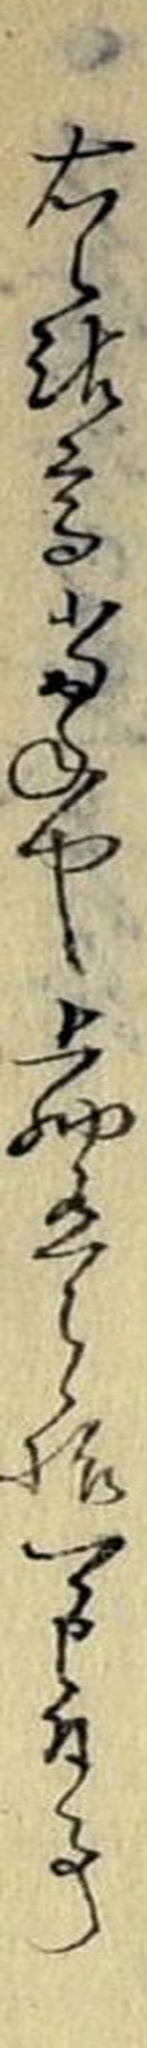右之銀高当年中上納有之候様可申付候事
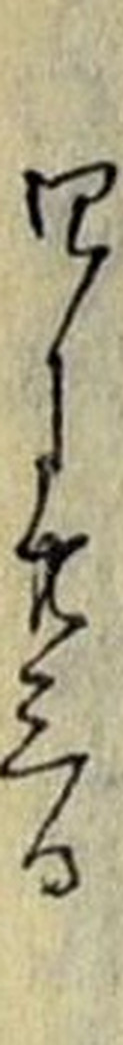四月廿三日
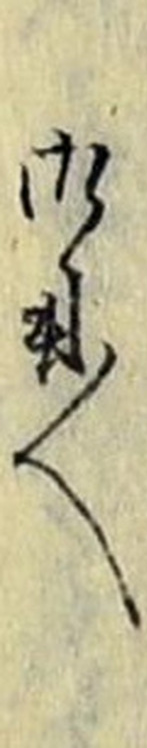御用人
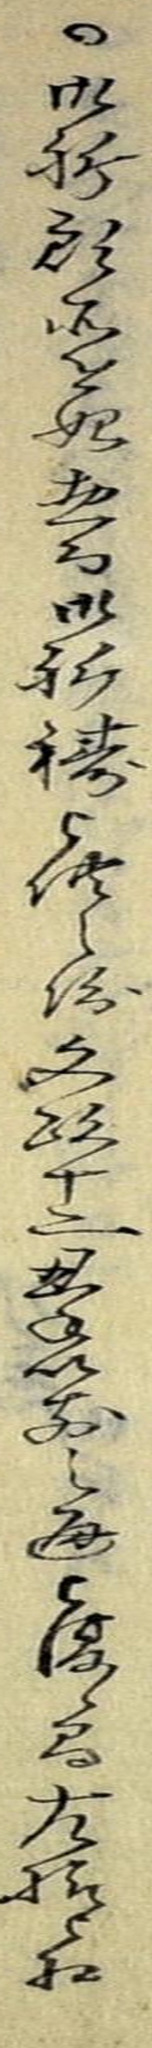○御祈願所を始惣而御祈祷被供之儀文政十二丑年以前之通被復候間左様被相
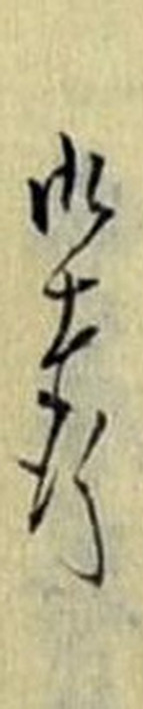御奉行
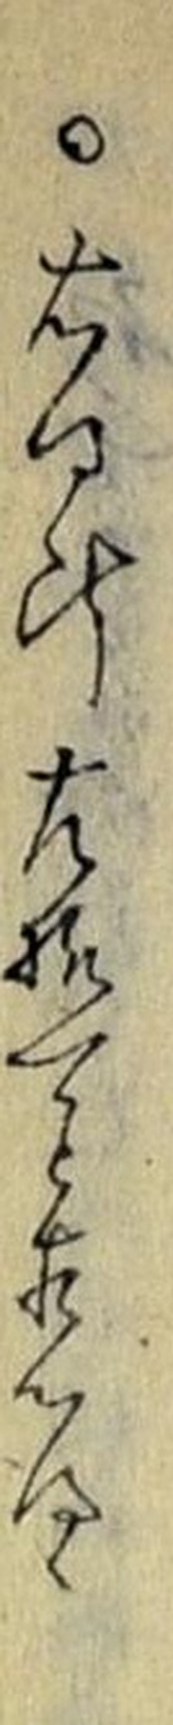○右同断左様可被相心得候
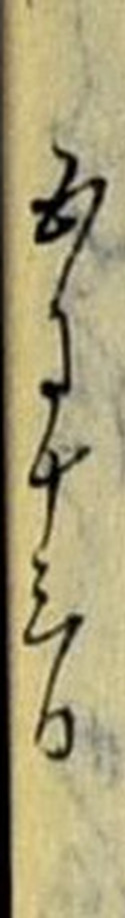五月十三日
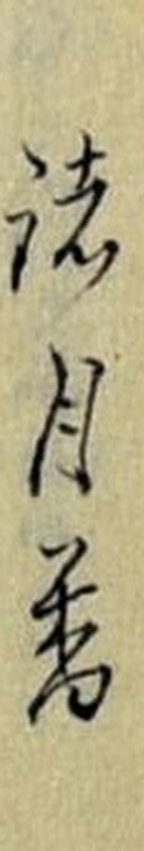諸月番
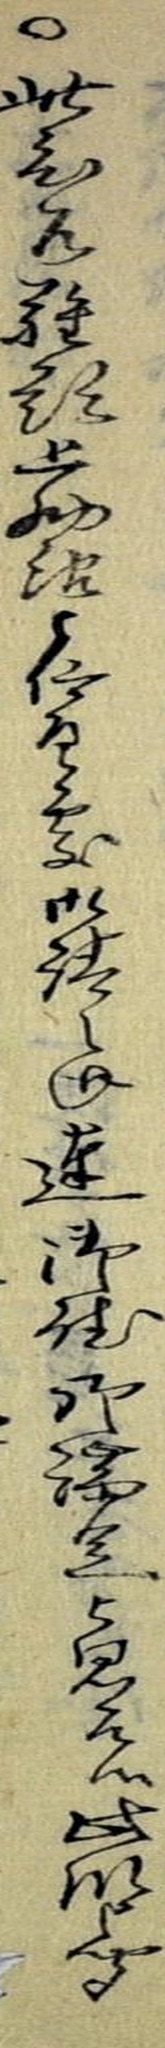○此度乍難題上納銀被仰付候処御請之趣達御聴御満足被思召候此段申申聞
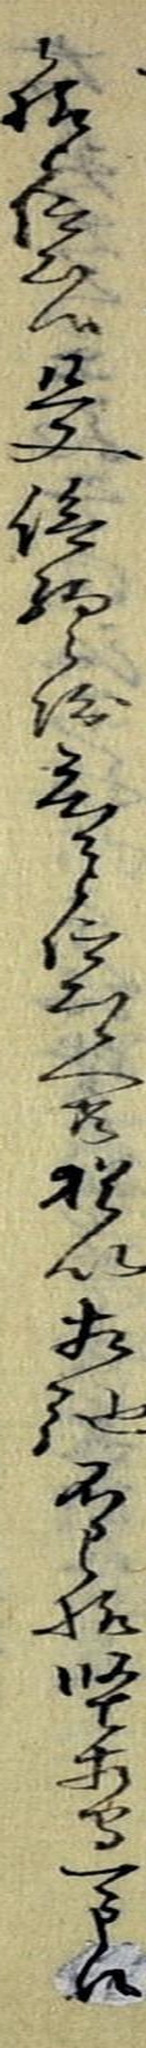候様被仰出候且又倹約之儀度々被仰出候へ共猶以相弛不申様堅相守可申候
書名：命令之部 六
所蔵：福井県文書館 Fukui Prefectural Archives
